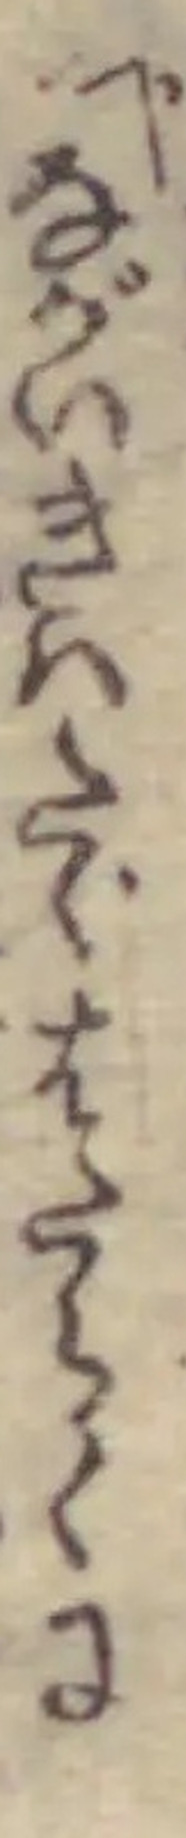〽ながいきはたゞはたらくに
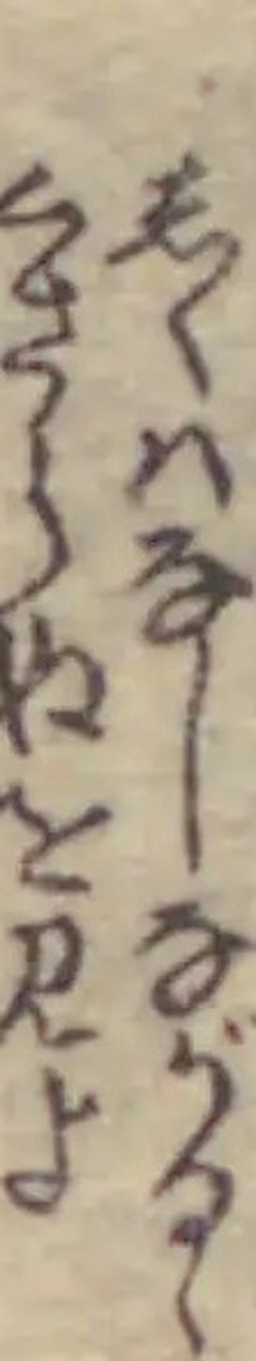くさらぬを見よ
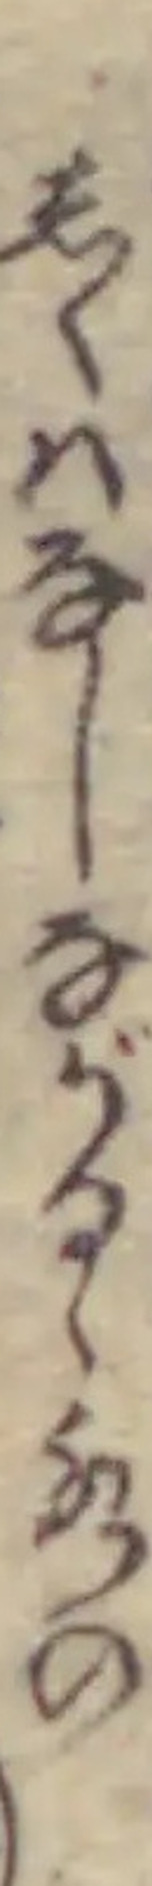しくはなしながるゝ水の
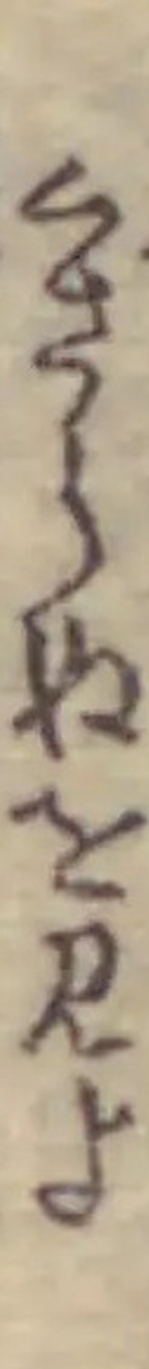くさらぬを見よ
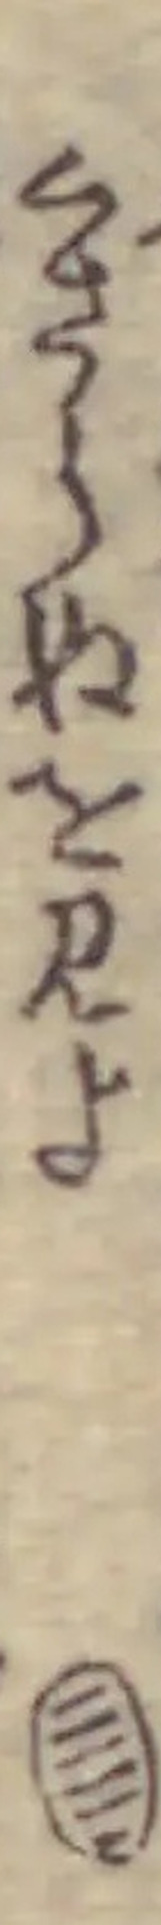くさらぬを見よ
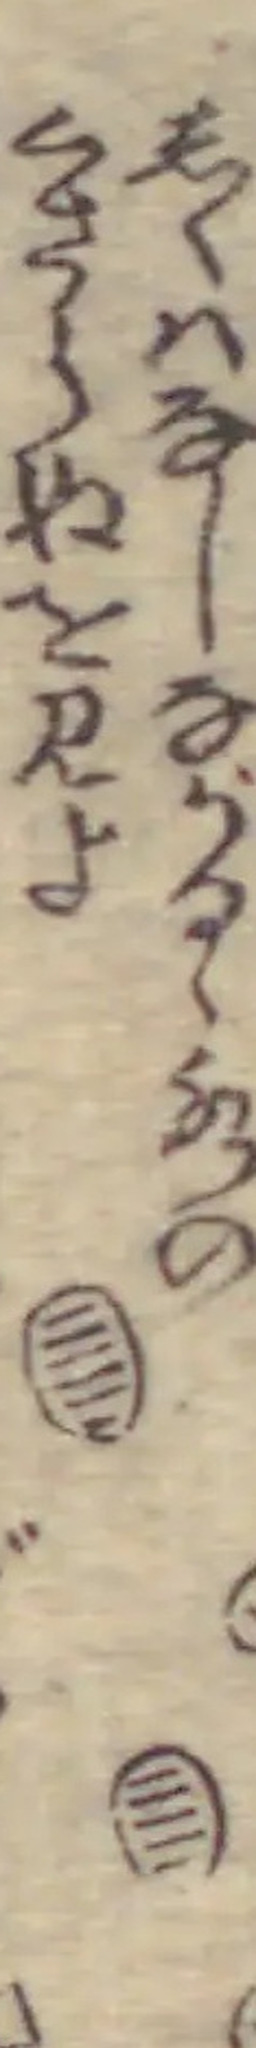くさらぬを見よ
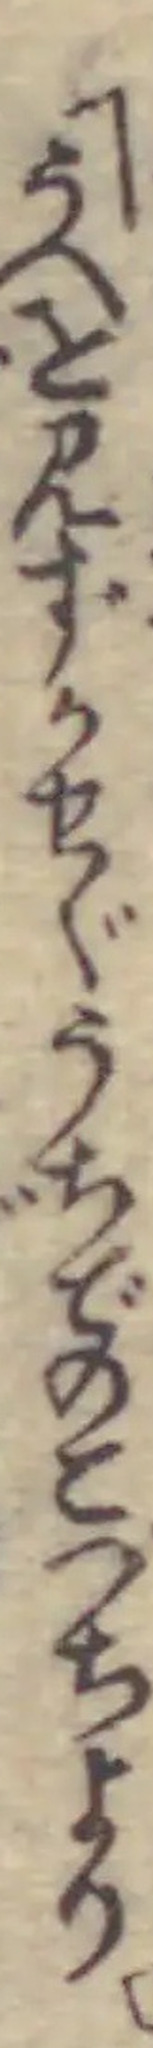〽うへを見ずかせぐうちでのこづちより
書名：腹内養生主論 3巻
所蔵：国立国会図書館 National Diet Library, JAPAN
